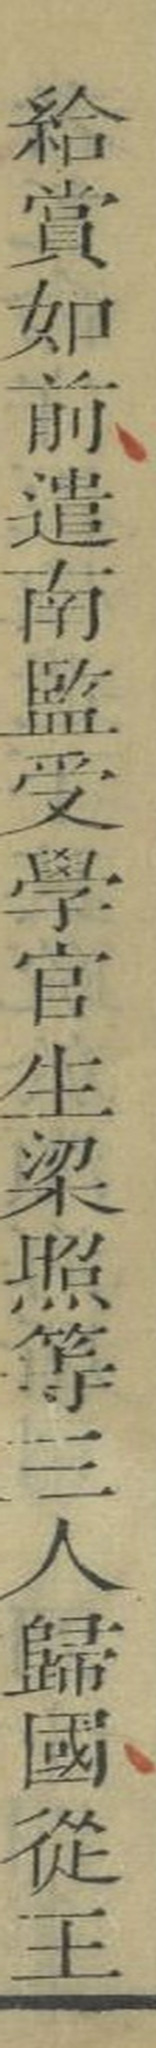給賞如前遣南監受学官生梁照等三人帰国従王
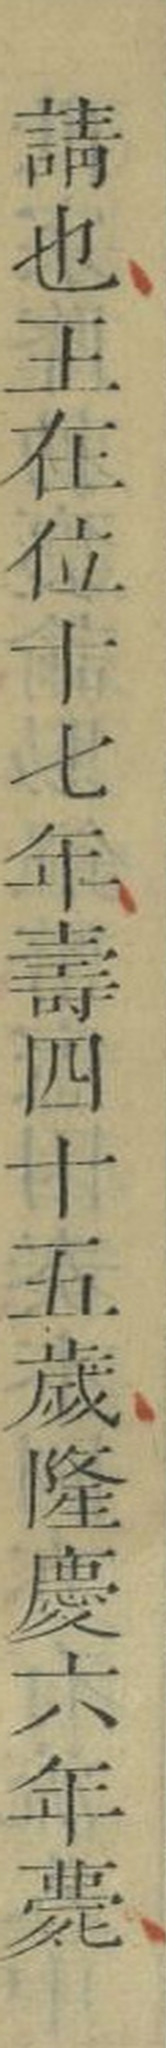請也王在位十七年寿四十五歳隆慶六年薨
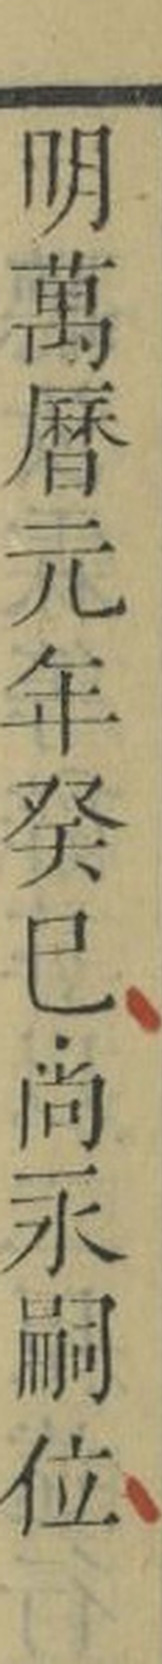明万暦元年癸巳尚永嗣位
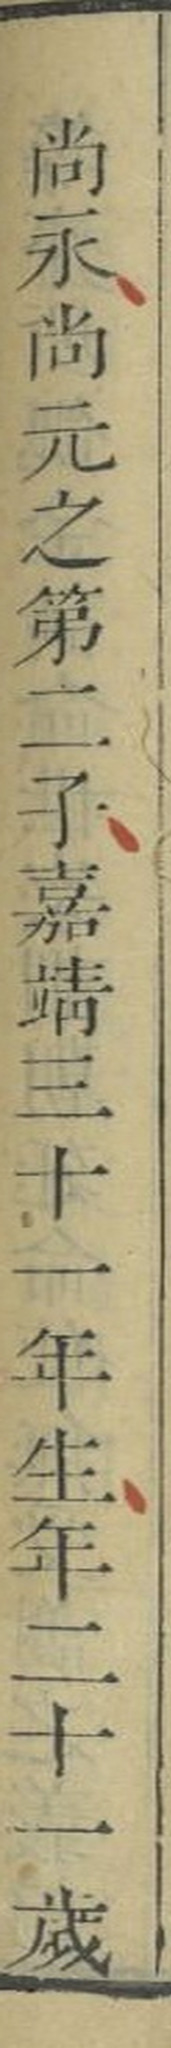尚永尚元之第二子嘉靖三十一年生年二十一歳
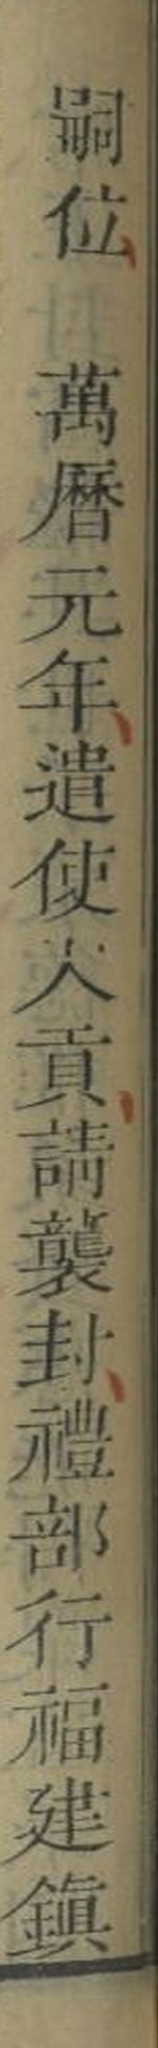嗣位万暦元年遣使入貢請襲封礼部行福建鎮
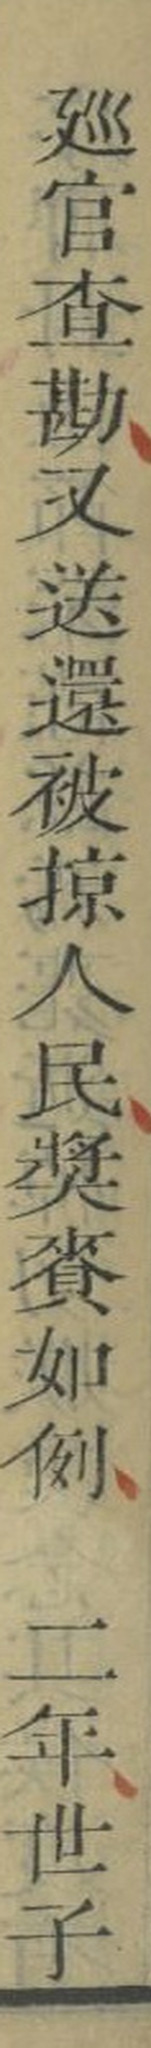巡官査勘又送還被掠人民奨賚如例二年世子
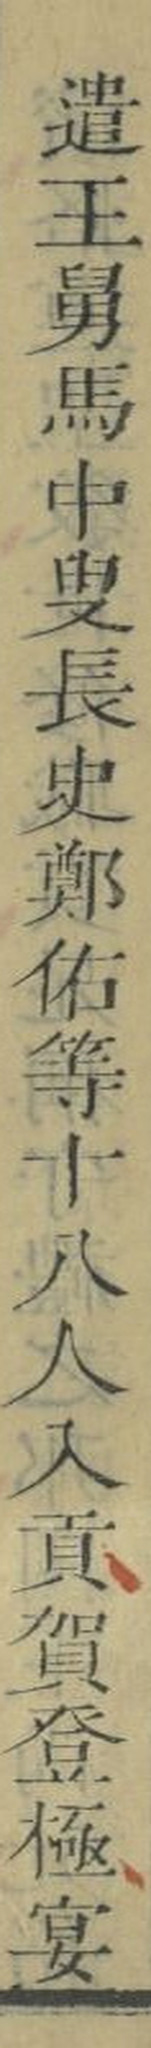遣王舅馬中叟長史鄭佑等十八人入貢賀登極宴
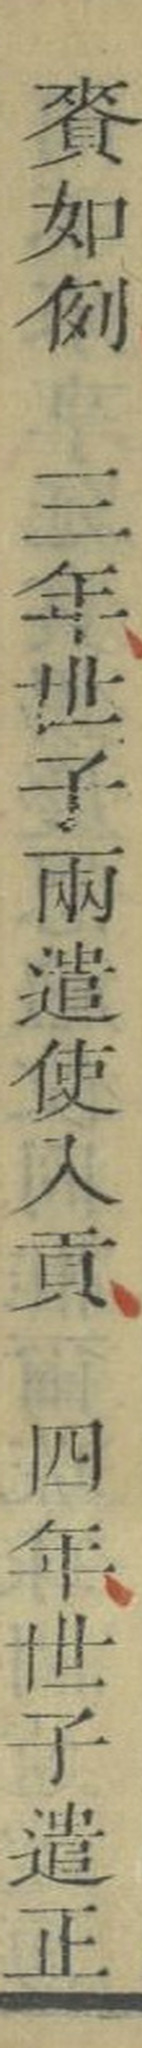賚如例三年世子両遣使入貢四年世子遣正
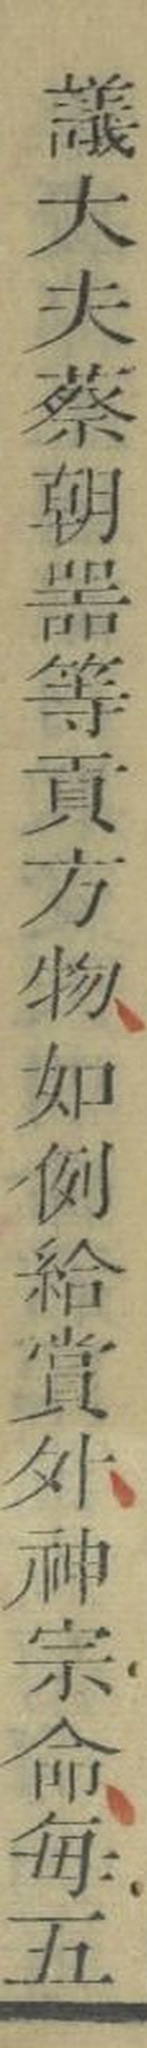議大夫蔡朝器等貢方物如例給賞外神宗命毎五
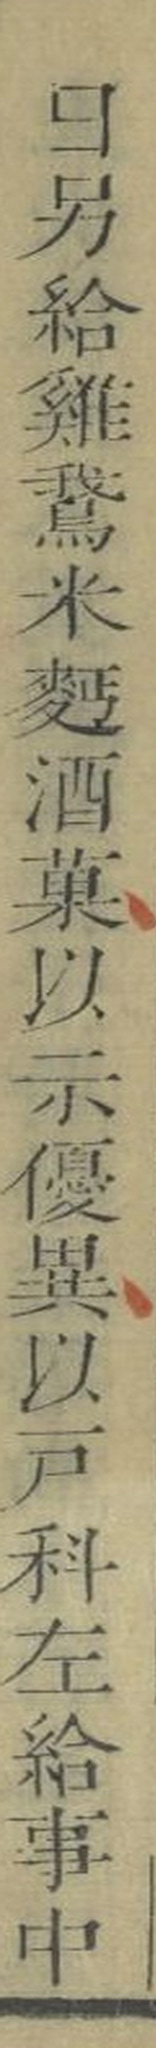日另給鶏鵞米麪酒菓以示優異以戸科左給事中
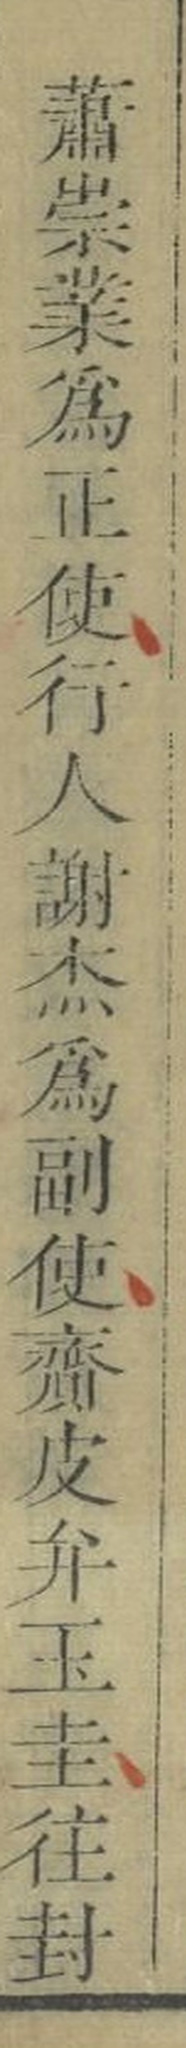蕭崇業為正使行人謝杰為副使齎皮弁玉圭往封
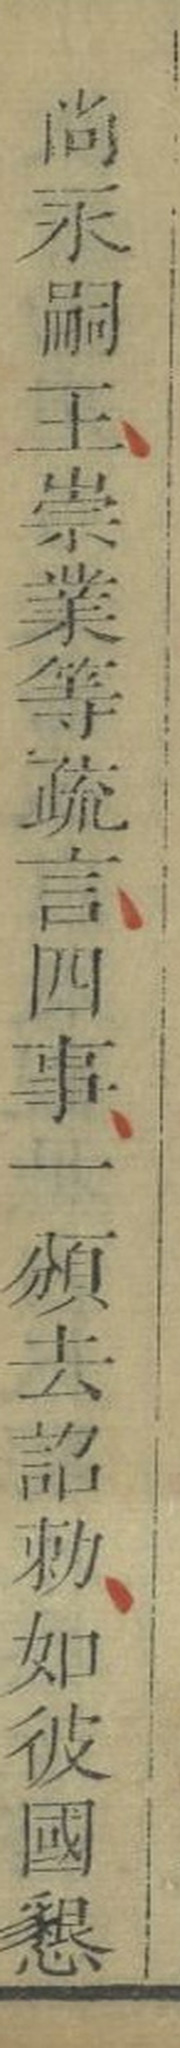尚永嗣王崇業等疏言四事一頒去詔勅如彼国懇
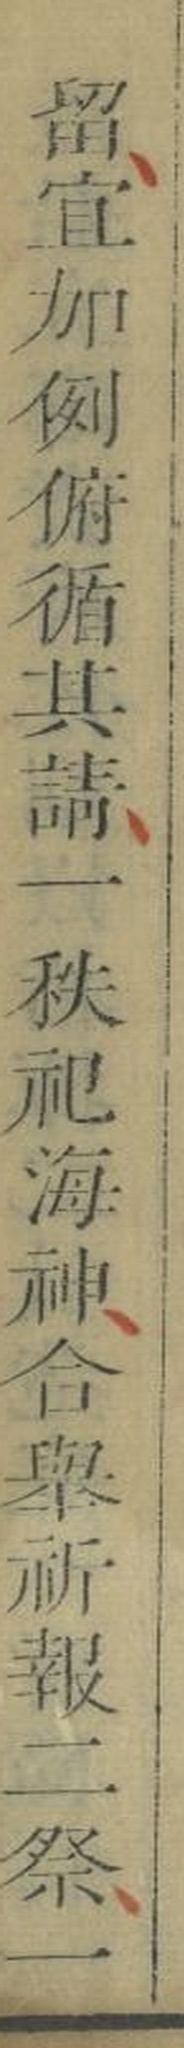留宜加例俯循其請一秩祀海神合挙祈報二祭一

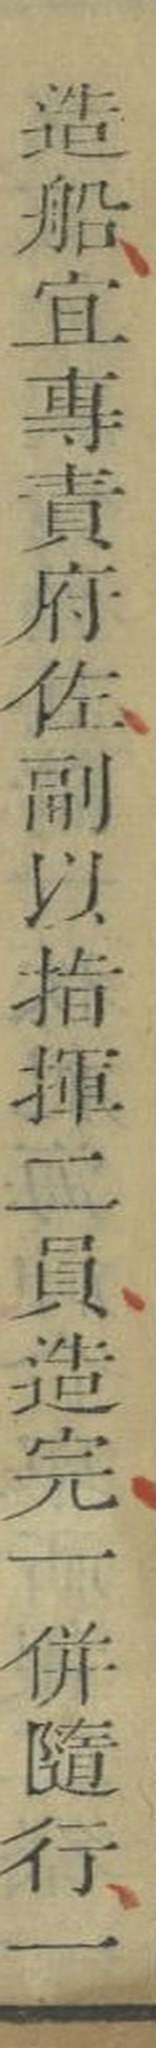造船宜専責府佐副以指揮二員造完一併随行一
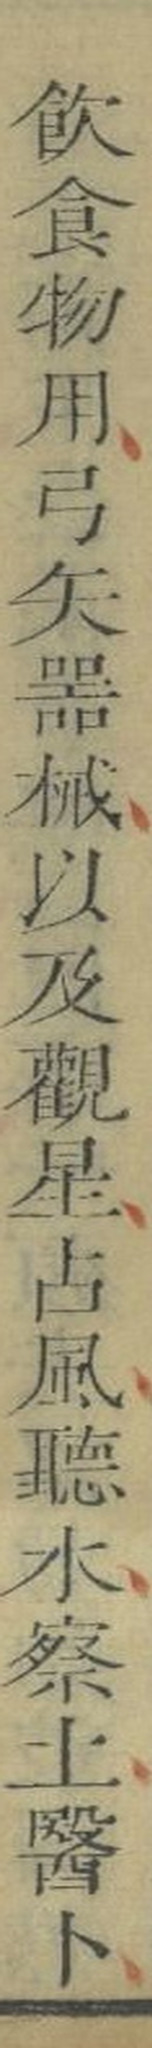飲食物用弓矢器械以及観星占風聴水察土医卜
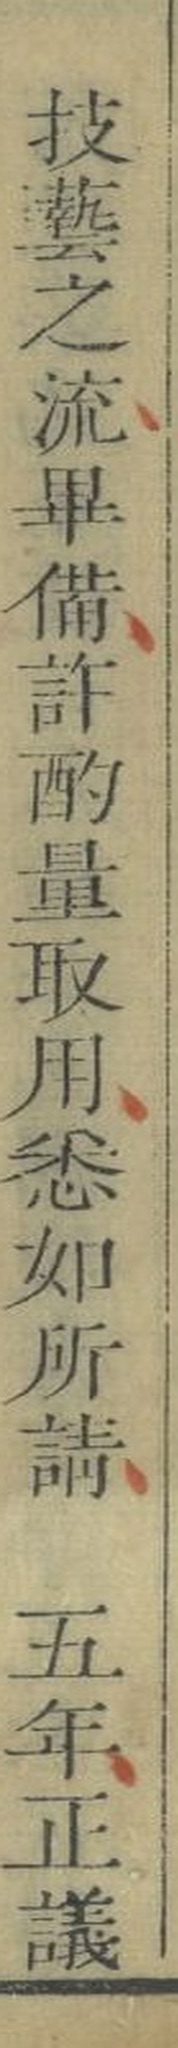技芸之流畢備許酌量取用悉如所請五年正議
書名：中山伝信録 巻三
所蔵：University of the Ryukyus Library
